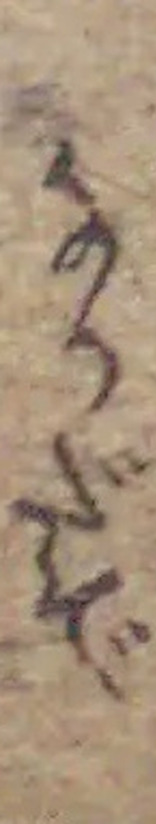なりだぞ
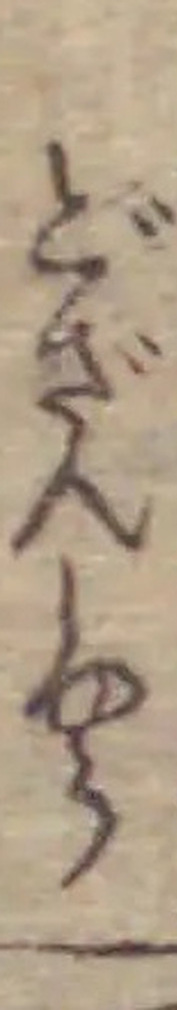ござんしやう

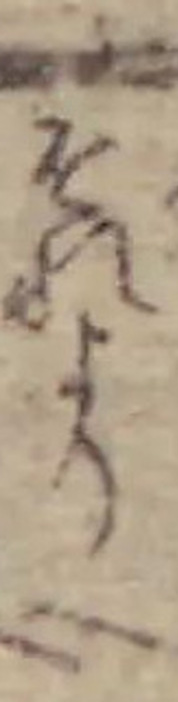それより
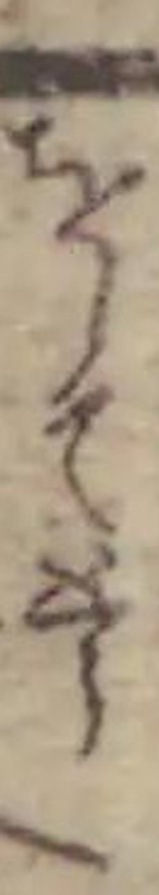をしてとう
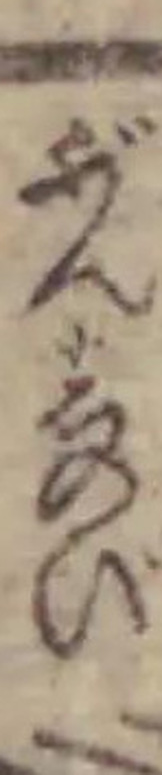ぶんしのび
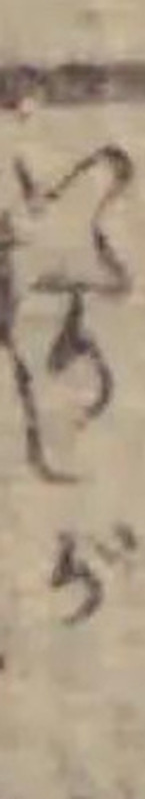いたりしが
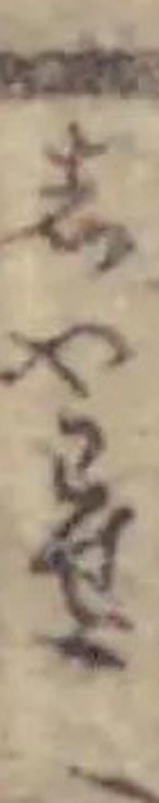しやわせ
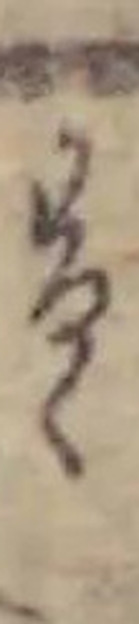わるく
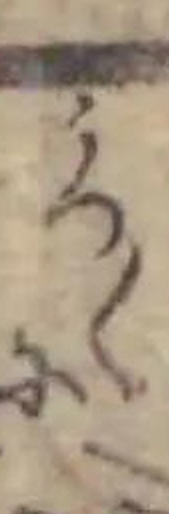うつ〳〵に
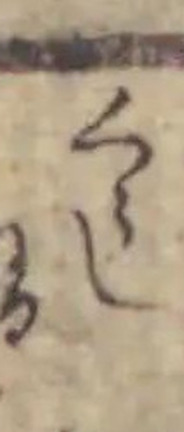くらし
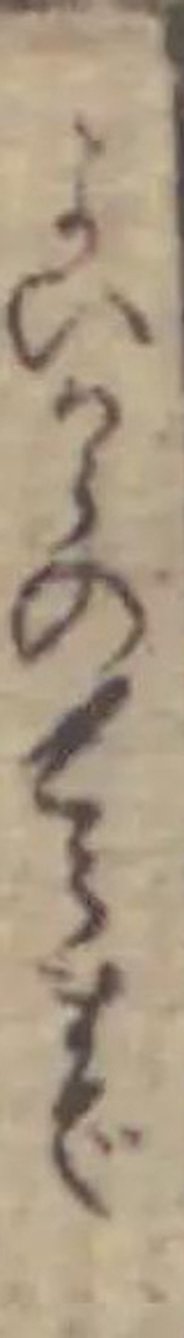よいからのてらまで
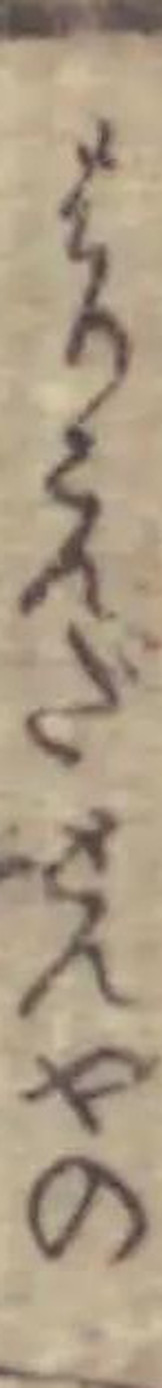はりこんだとんやの
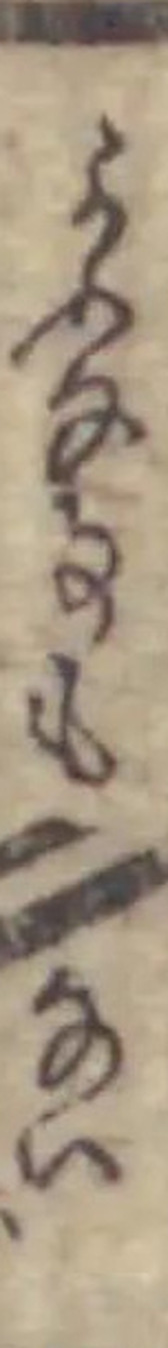よふな事もない
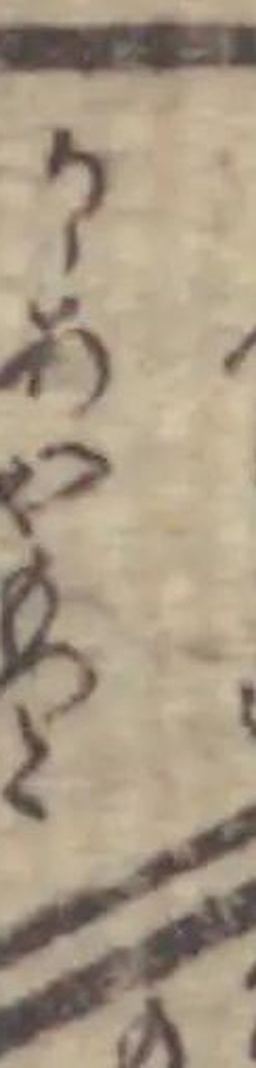かゝあやもつと
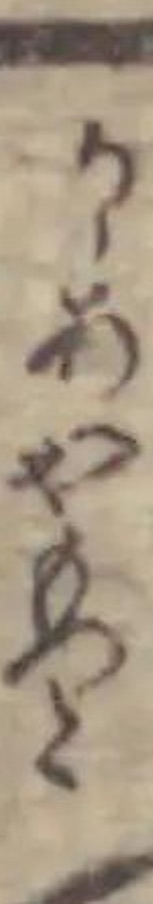かゝあやもつと
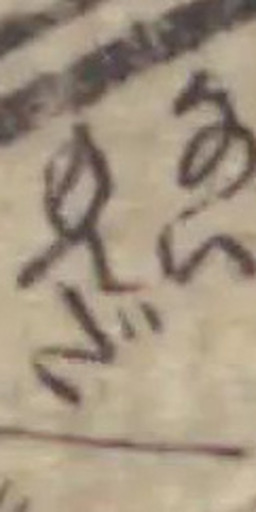もんだ
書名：奥州咄 3巻
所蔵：国立国会図書館 National Diet Library, JAPAN
